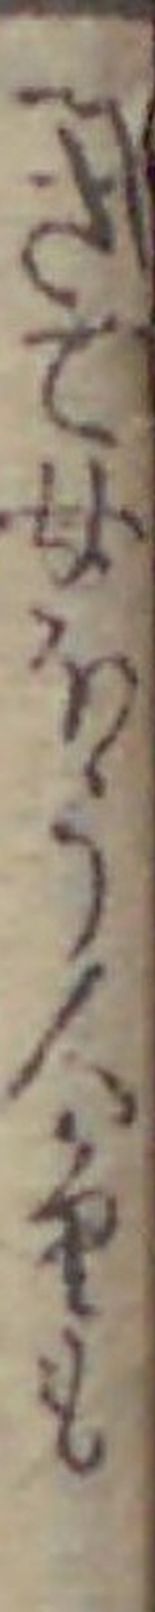〽さて女ほう人魚も
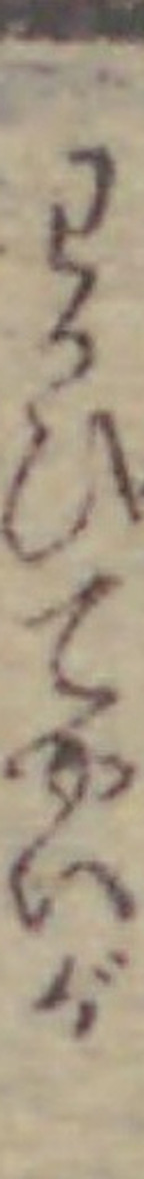わかひてやいが
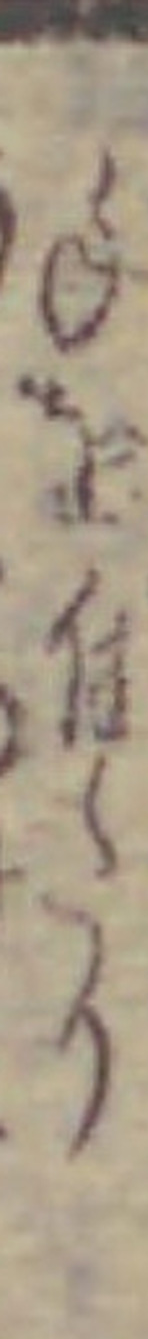手を付たり
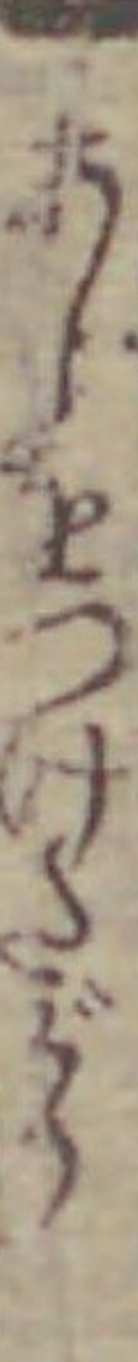あしをつけたがりし
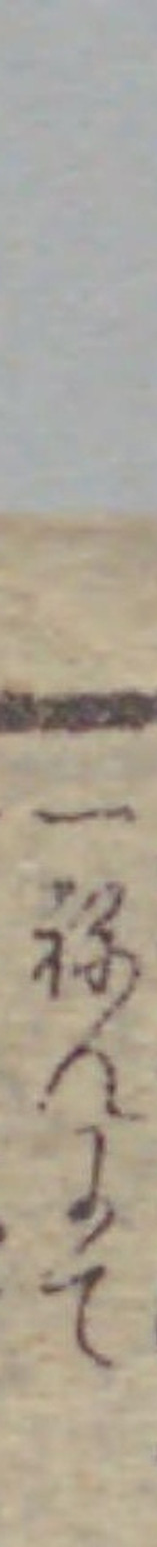一ねんにて
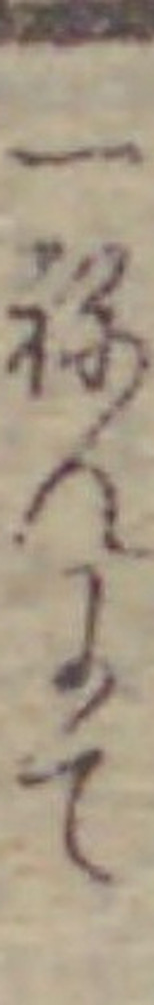一ねんにて
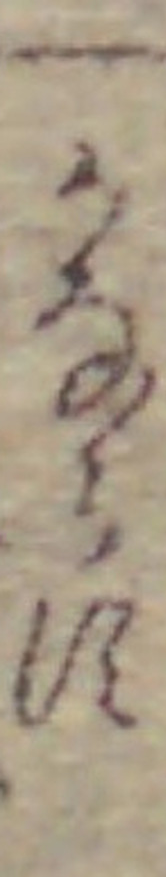かならす
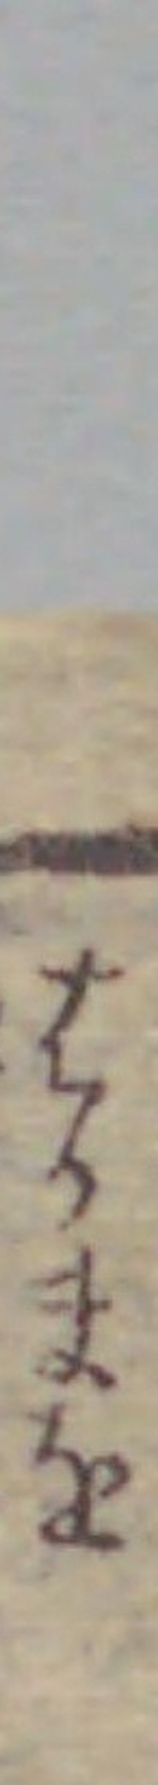はかまを
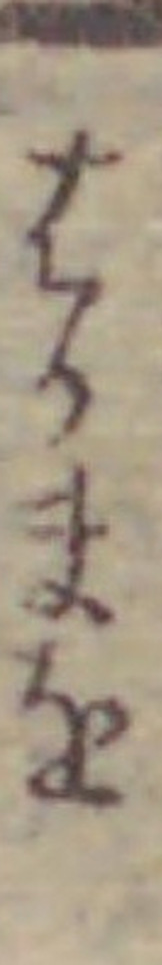はかまを
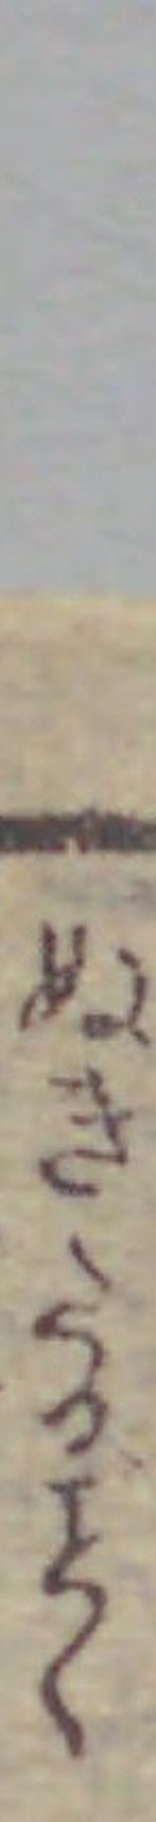ぬきたることく
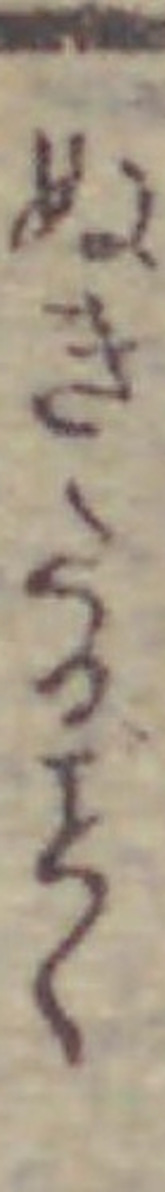ぬきたることく
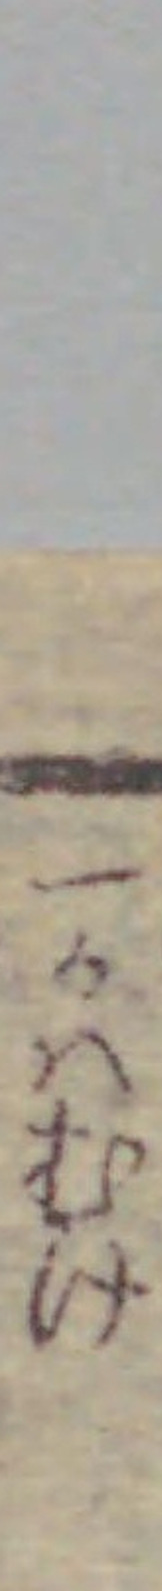一かはむけ
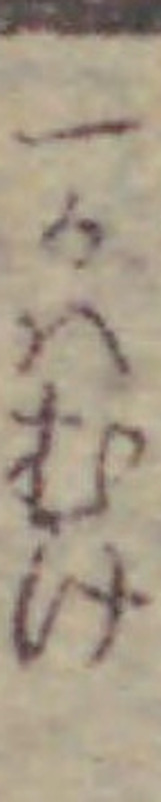一かはむけ
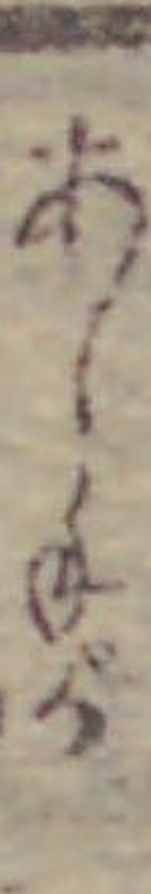あし手が
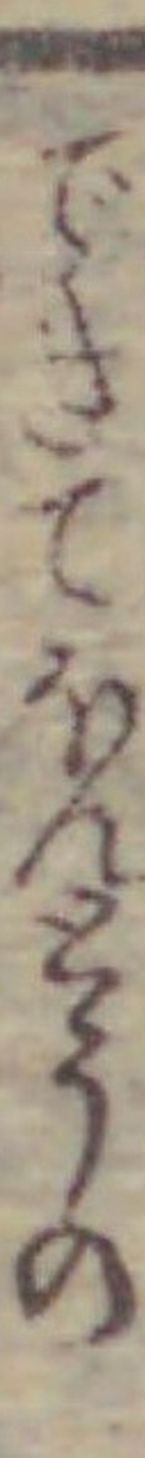できてほんとうの
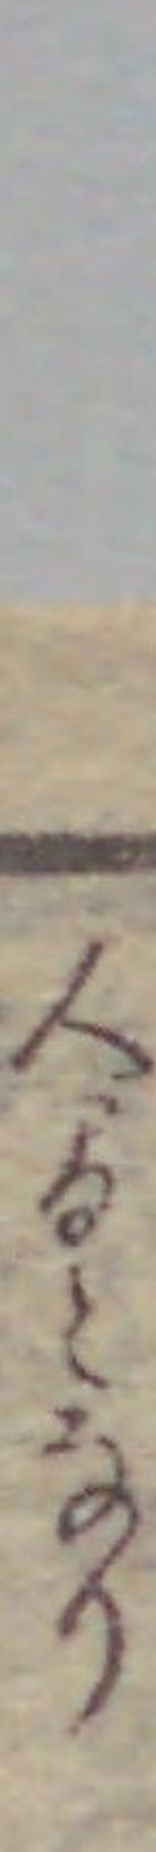人間となり
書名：箱入娘面屋人魚 3巻
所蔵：国立国会図書館 National Diet Library, JAPAN
